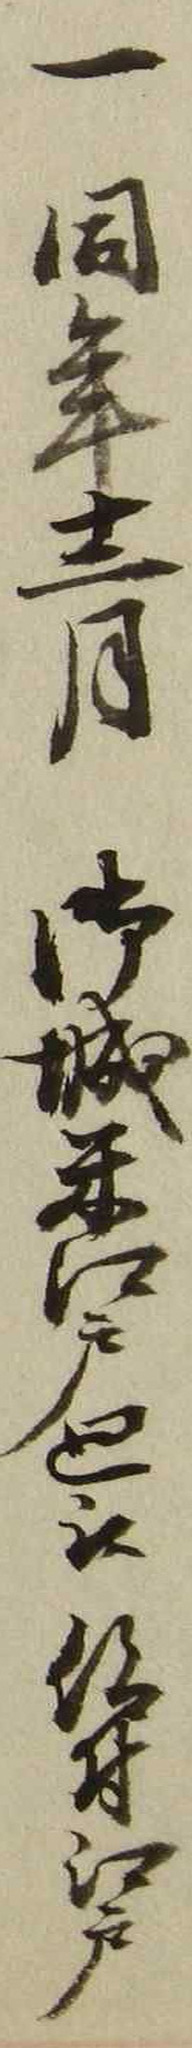一同年十二月御城米江戸廻被仰付江戸
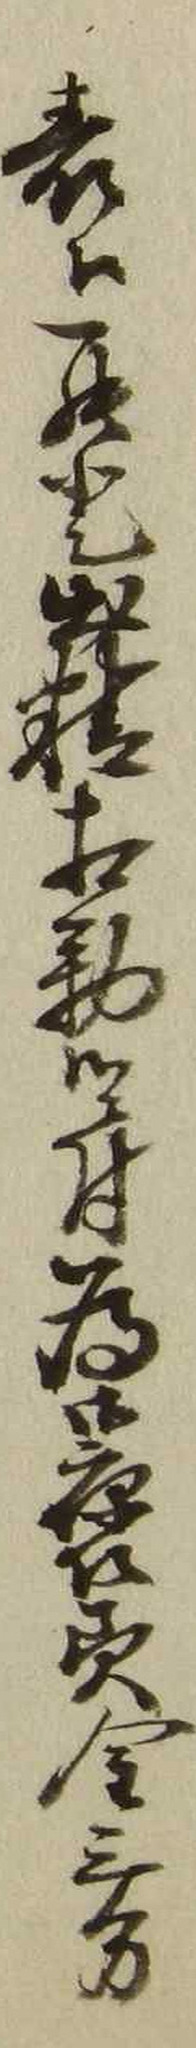表え罷登出精相勤候に付為御褒美金三分
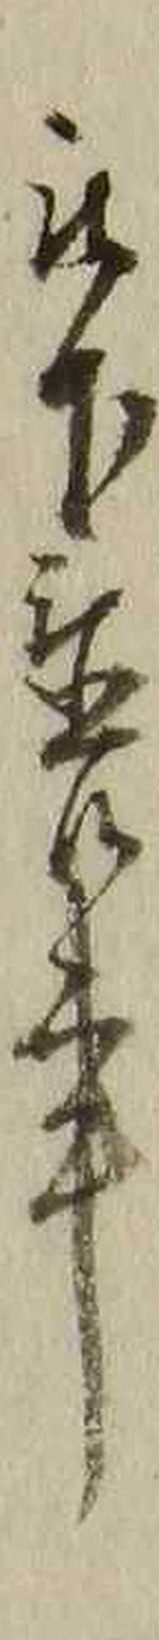被下置候事
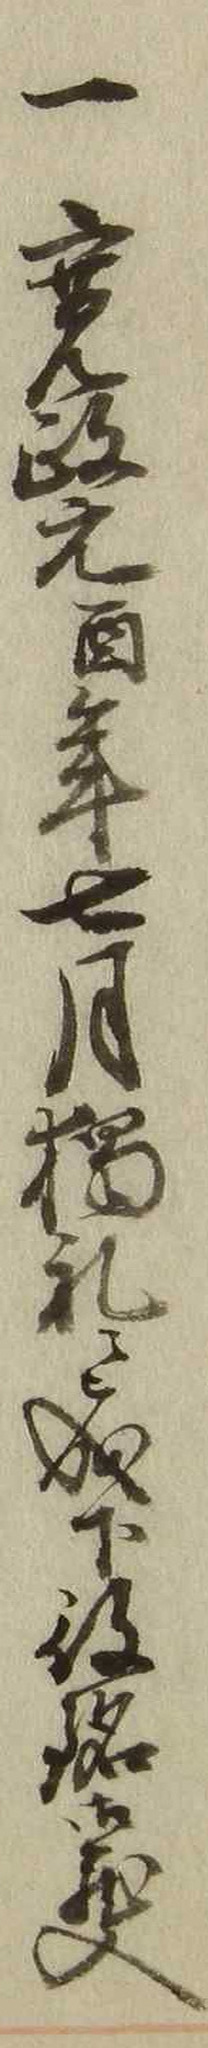一寛政元酉年七月独礼に被成下役銘御蔵入
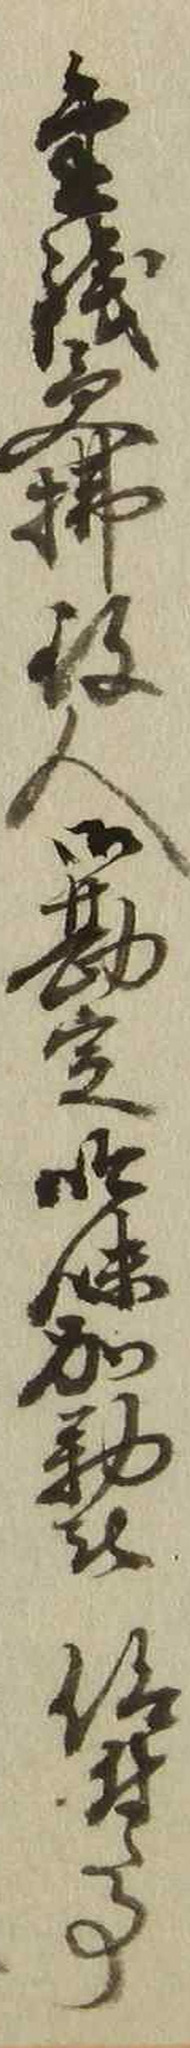金銭受払役人御勘定吟味加勤被仰付候事
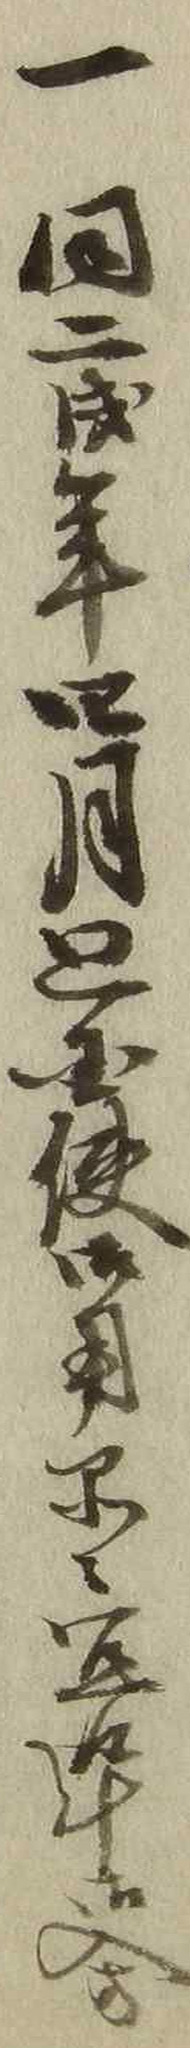一同二戌年四月廻国使御用品々宜取計御入方
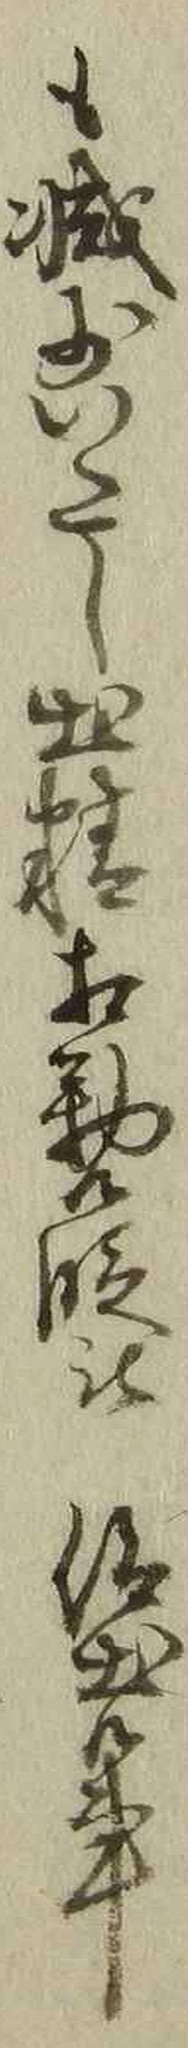も減少いたし出精相勤候段被仰出候事
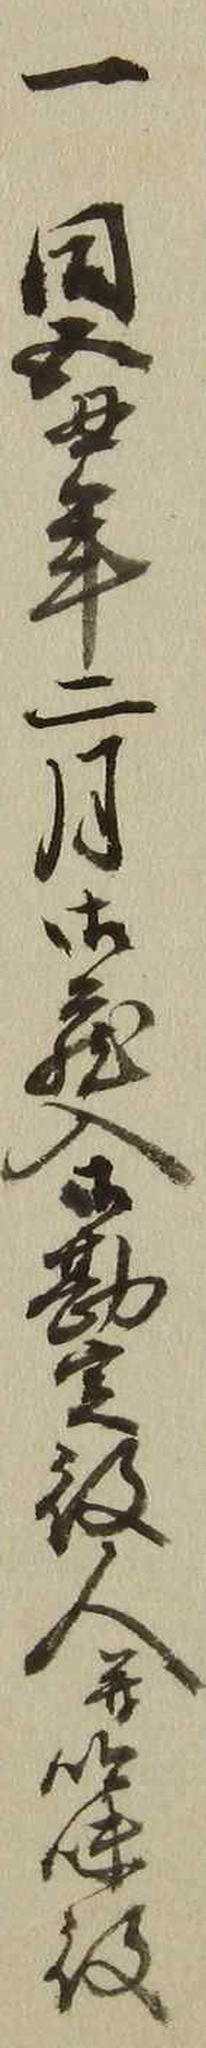一同五丑年二月御蔵入御勘定役人并吟味役
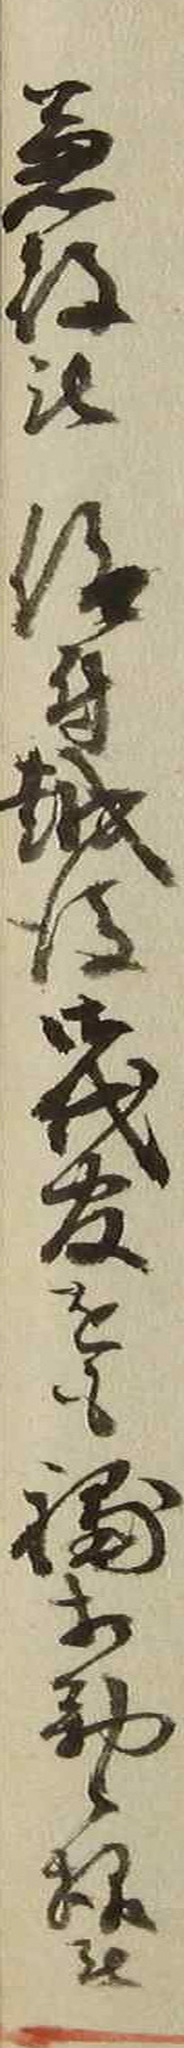兼役被仰付越後御代官をも補相勤候様被
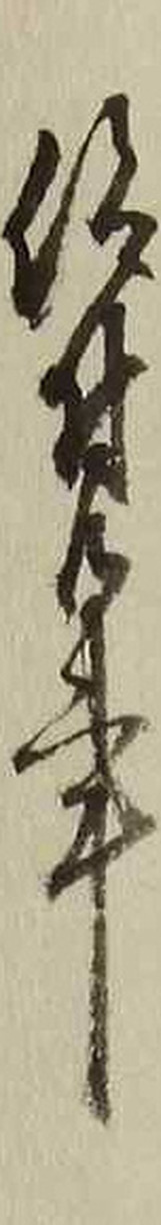仰付候事
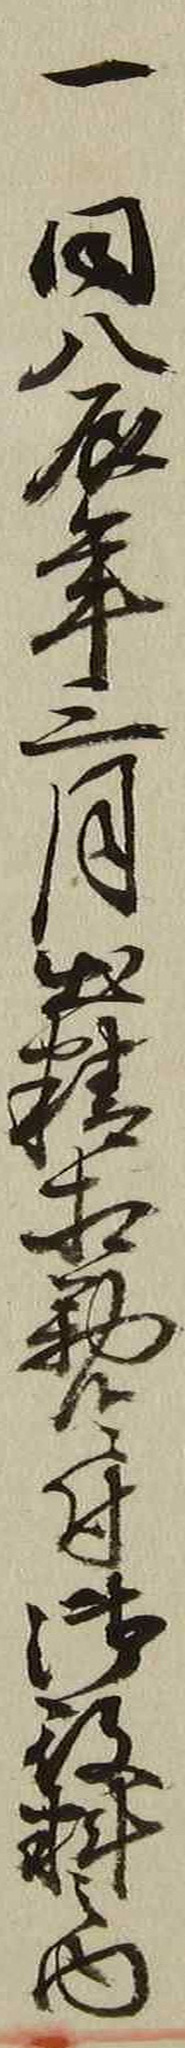一同八辰年三月出精相勤候に付御役料之内
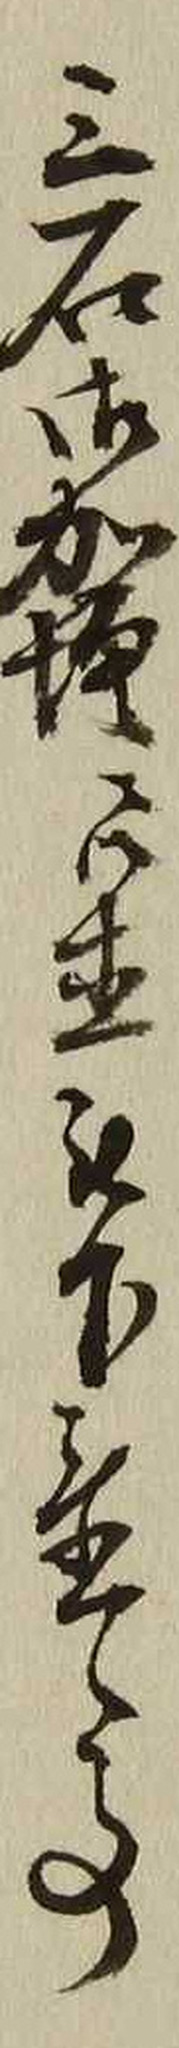三石御加増に御直被下置候事
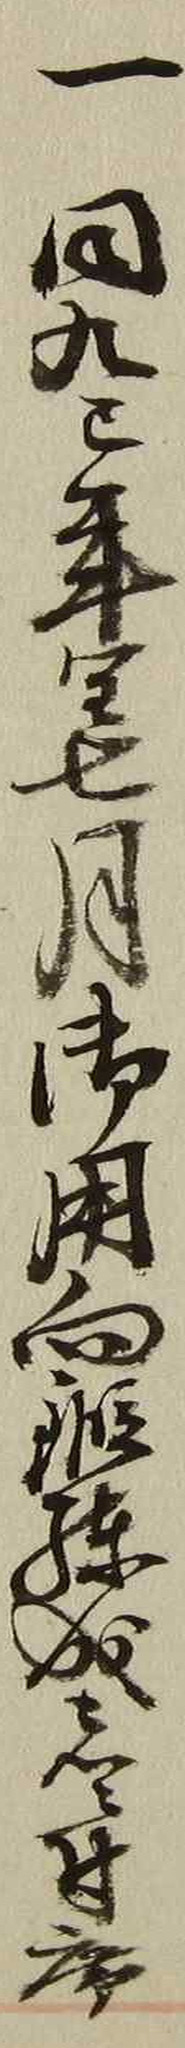一同九巳年閏七月御用向鍛錬成者に付席
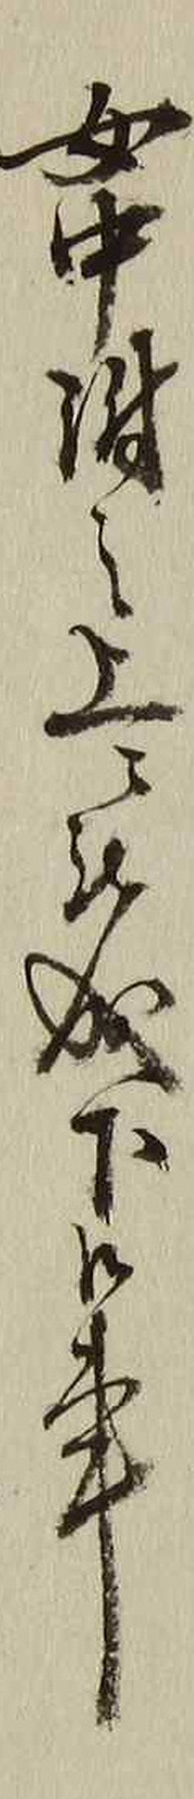女中附之上に被成下候事
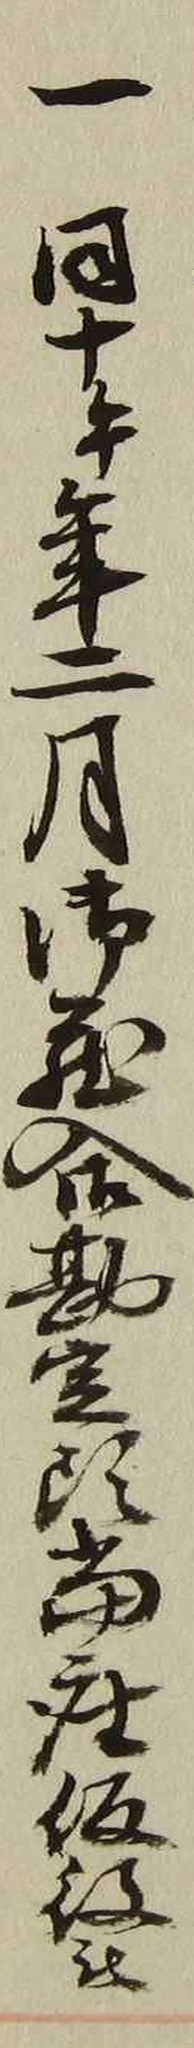一同十午年二月御蔵入御勘定頭当座仮役被
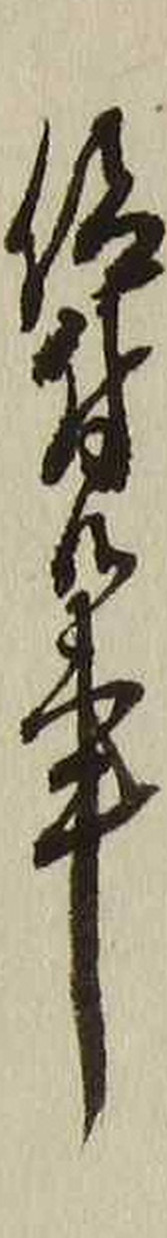仰付候事
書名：諸士系譜　巻之38　は之部6
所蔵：会津若松市立会津図書館
